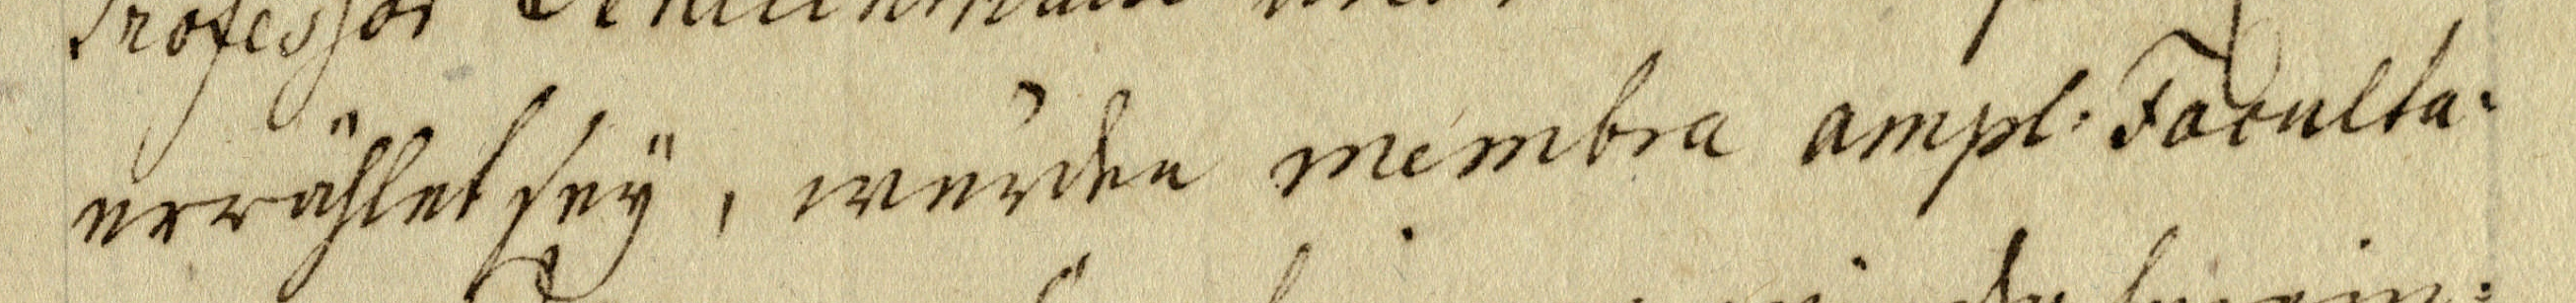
erwählet seÿ, wurden membra ampl. Faculta¬
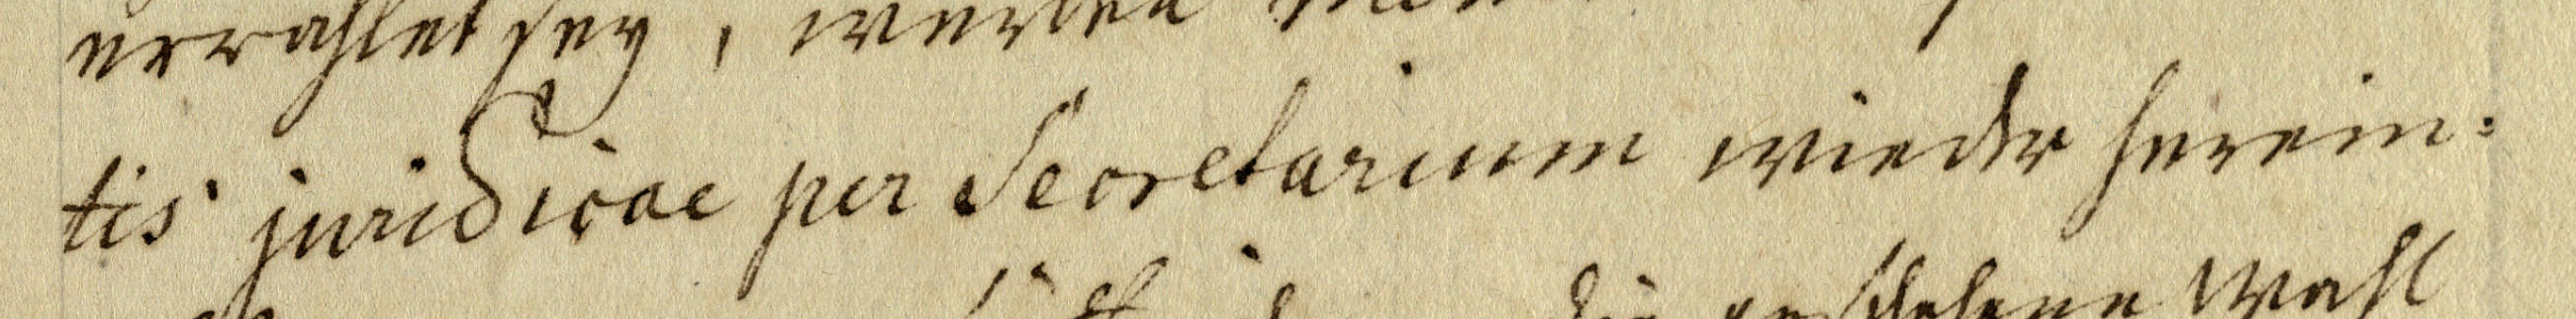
tis juridicae per Secretarium wieder herein¬
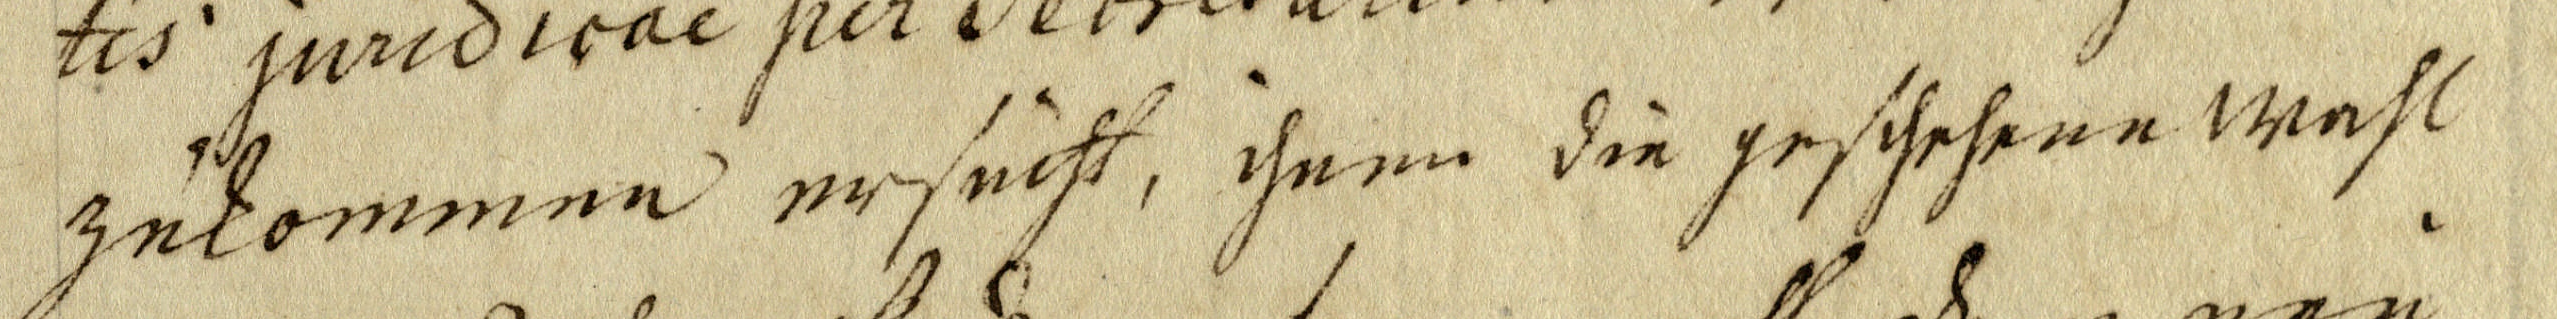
zukommen ersucht, ihnen die geschehene Wahl
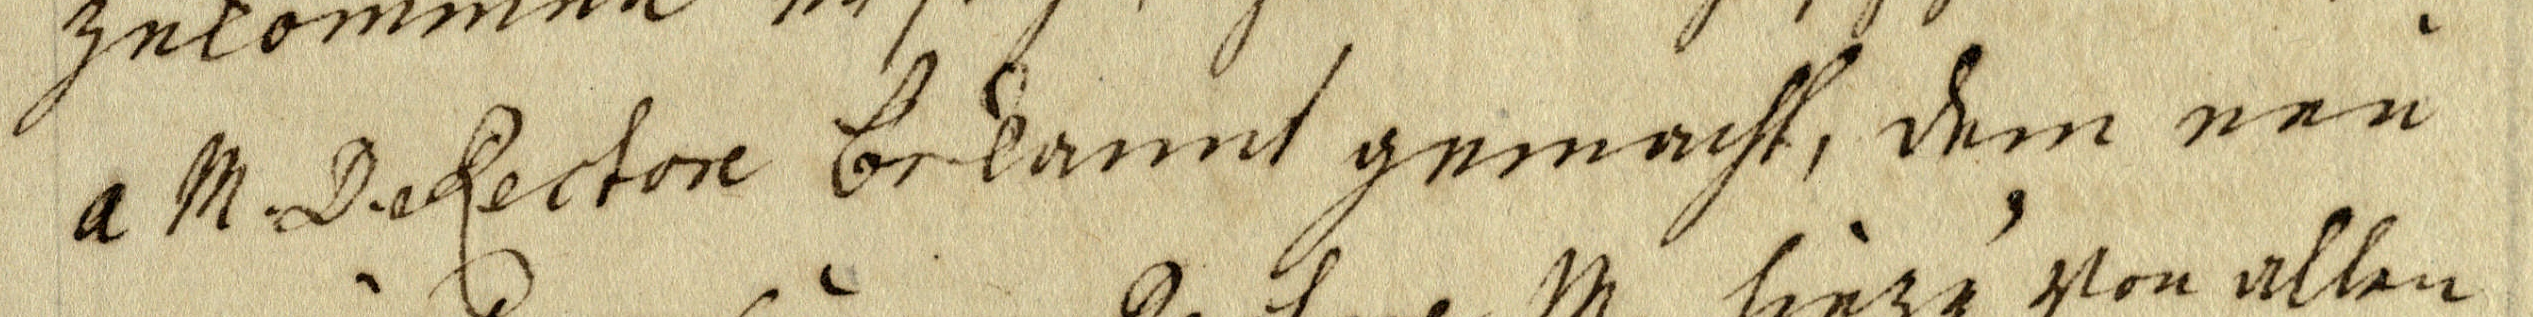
a. M. D. Rectore bekannt gemacht, dem neu
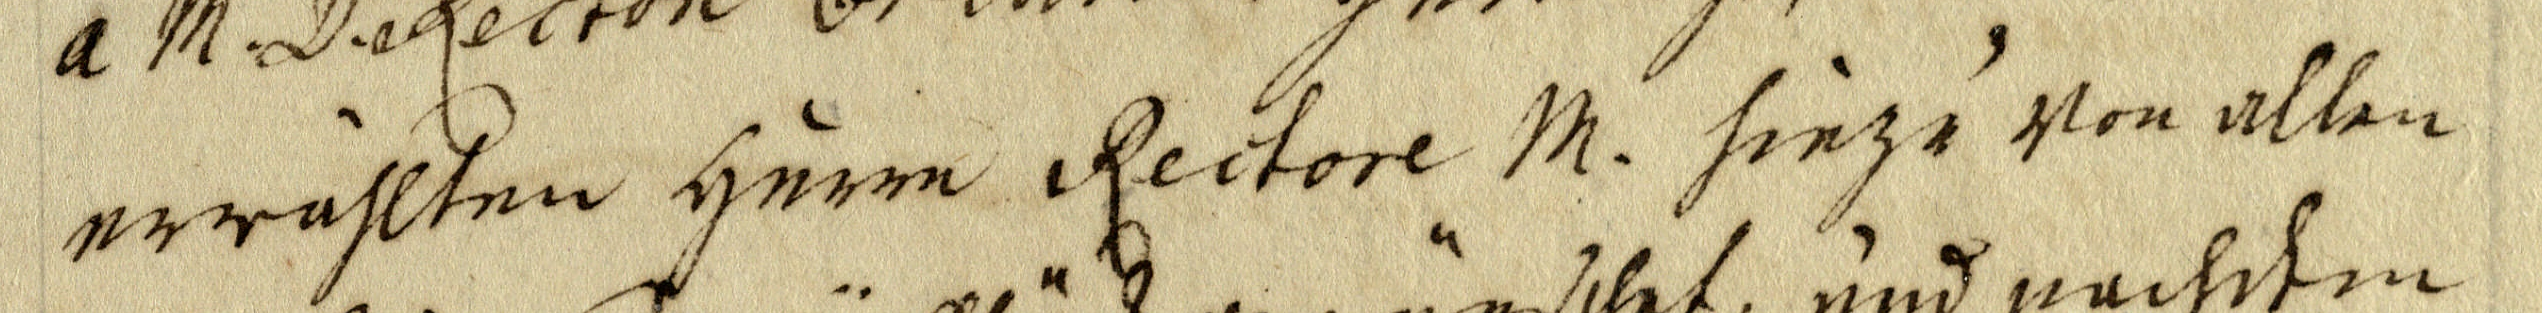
erwählten Herrn Rectore M. hiezu von allen
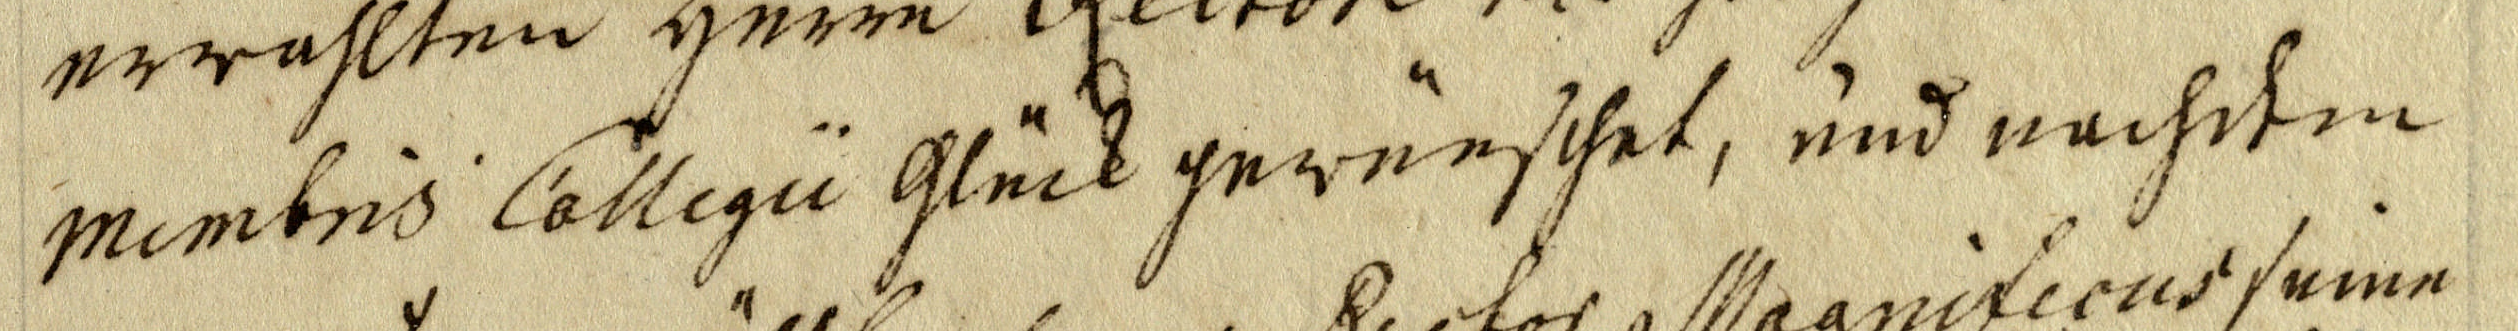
Membris Collegii Glück gewünschet, und nachdem
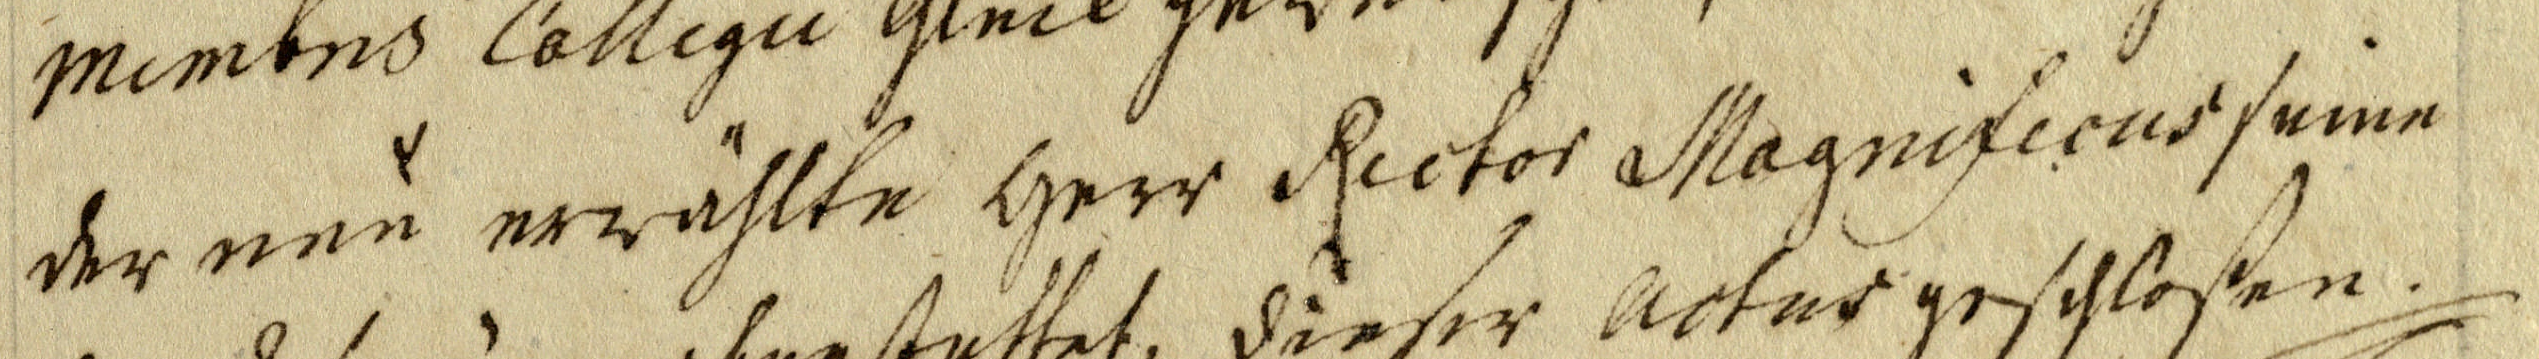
der neue erwählte Herr Rector Magnificus seine
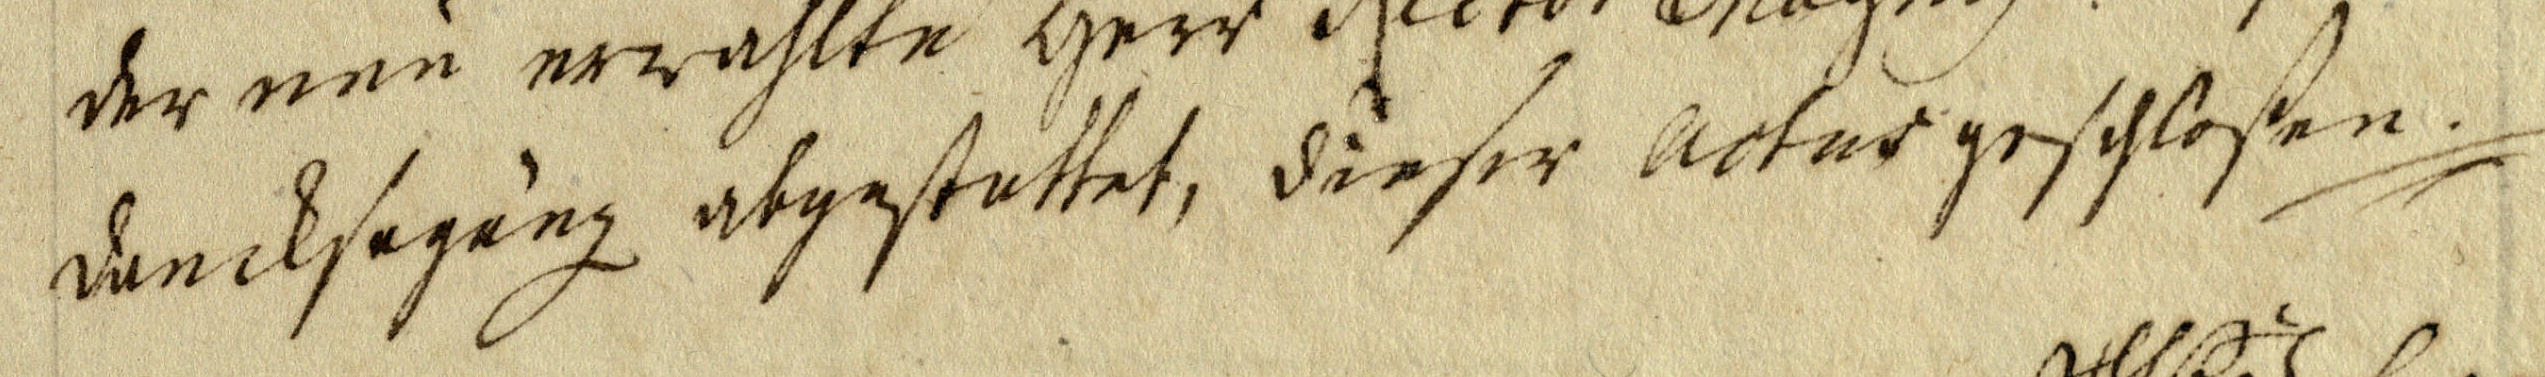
Dancksagung abgestattet, dieser Actus geschloßen.
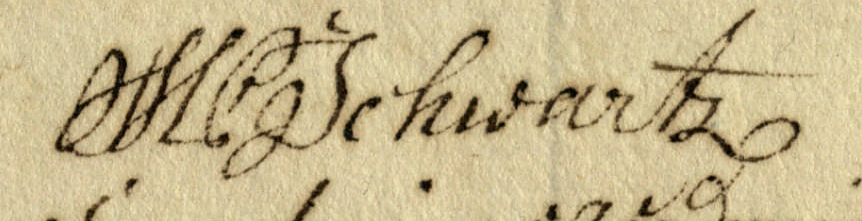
M C Schwartz
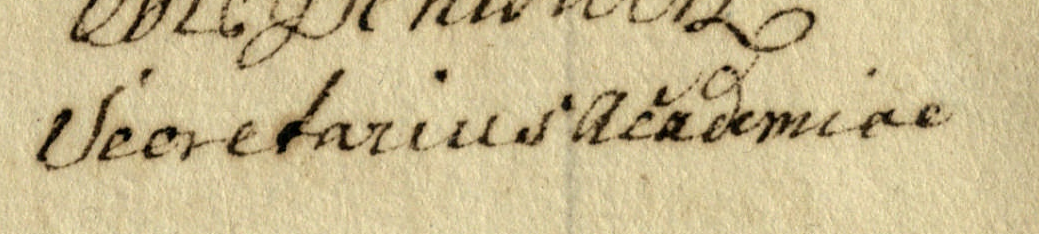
Secretarius Academiae
